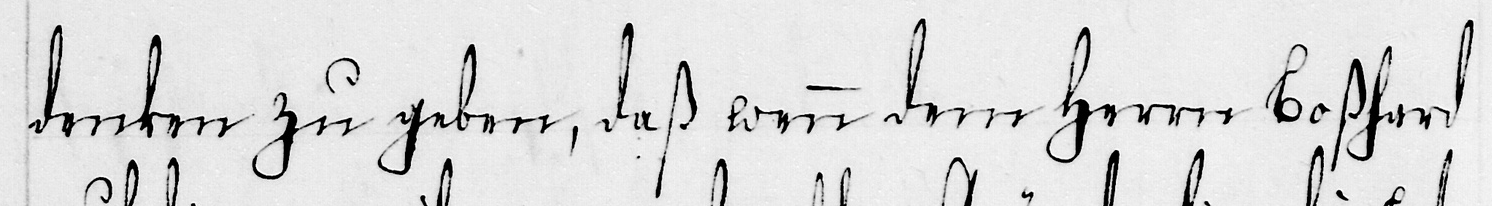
denken zu geben, daß wenn dem Herrn Boßhard
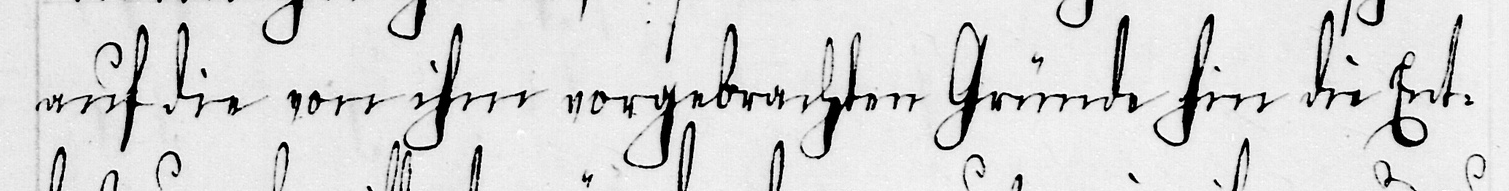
auf die von ihm vorgebrachten Gründe hin die Ent¬
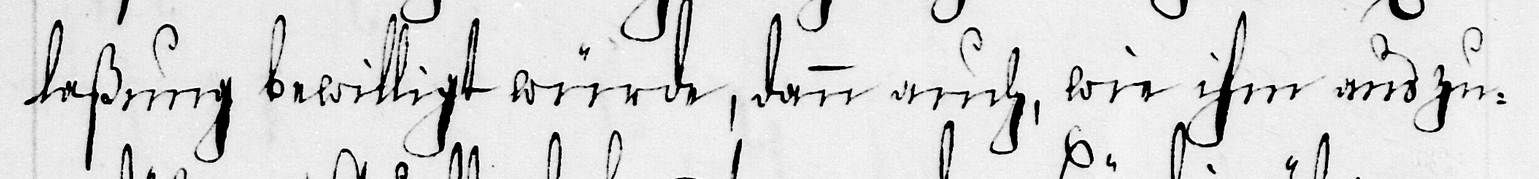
laßung bewilligt würde, dann auch, wie ihm aus zu¬
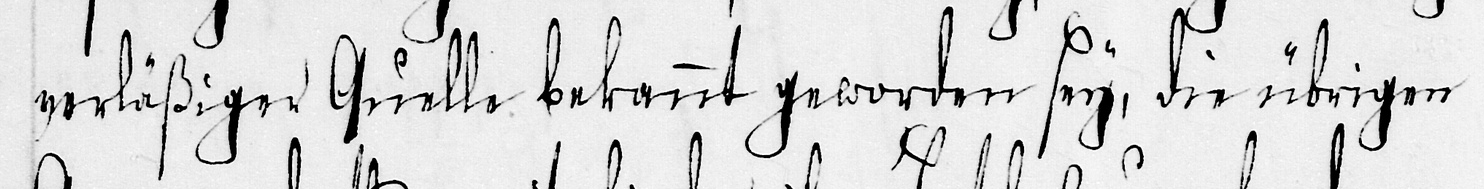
verläßiger Quelle bekannt geworden sey, die übrigen
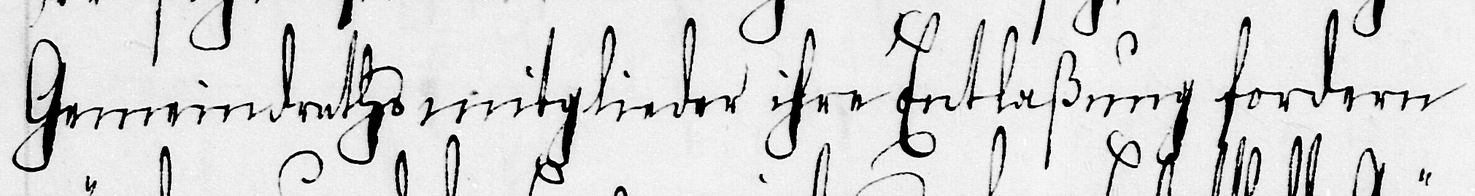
Gemeindrathsmitglieder ihre Entlaßung fordern
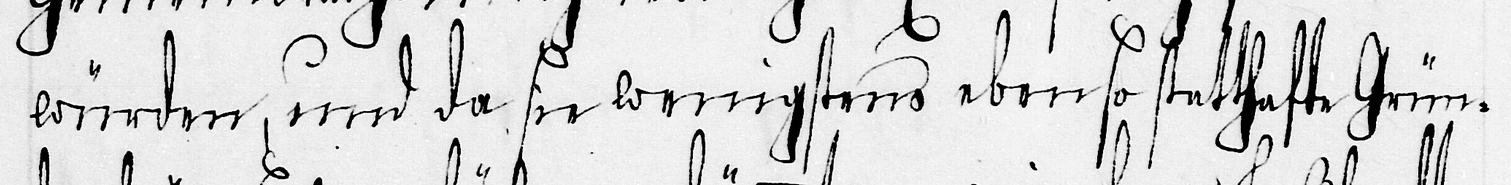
würden, und da sie wenigstens ebenso statthafte Grün¬
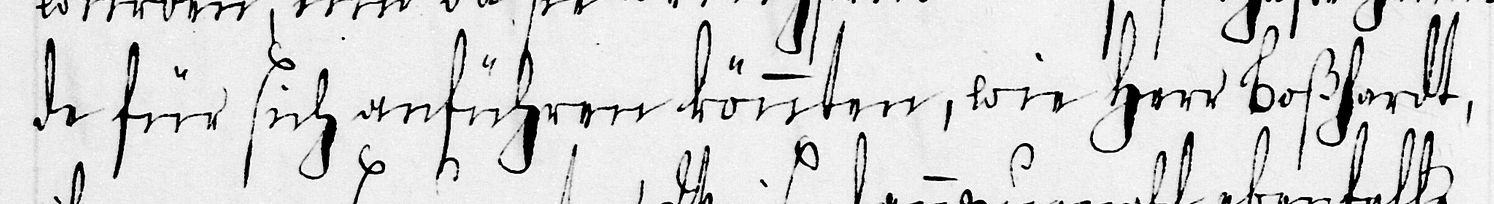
de für sich anführen könnten, wie Herr Boßhardt,
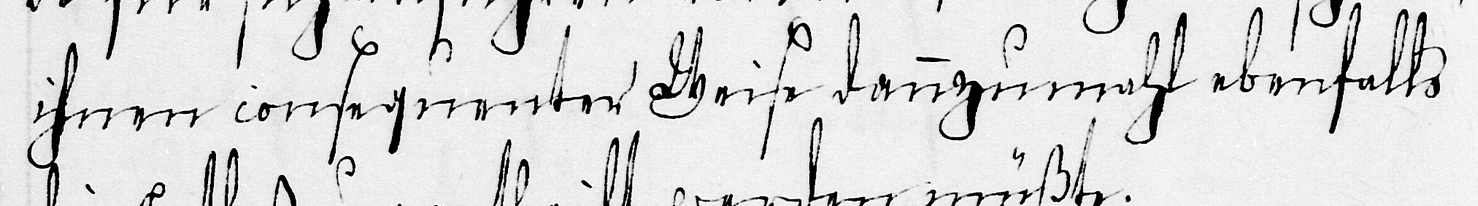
ihnen consequenter Weise dannzumahl ebenfalls
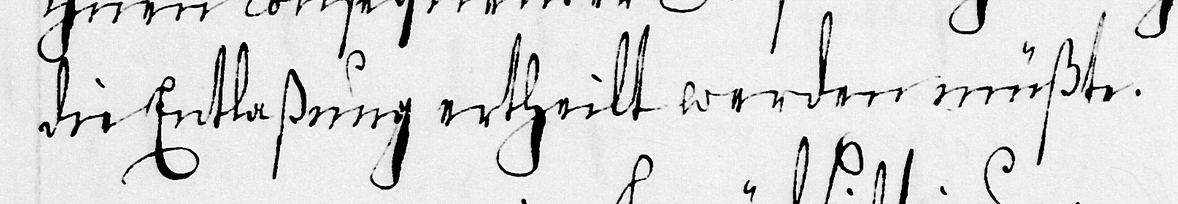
die Entlaßung ertheilt werden müßte.
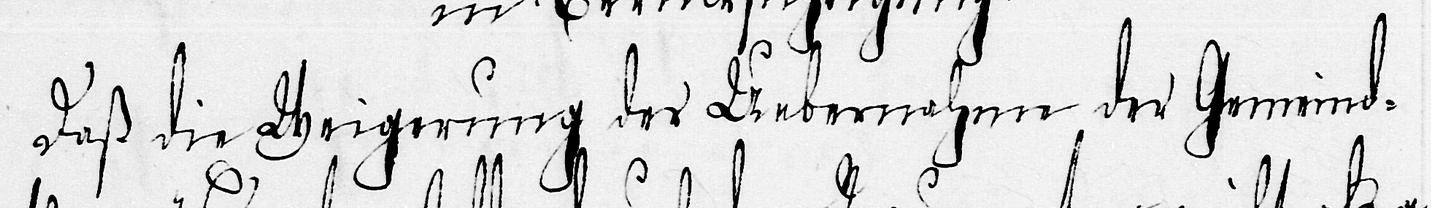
Daß die Weigerung der Uebernahme der Gemeind¬
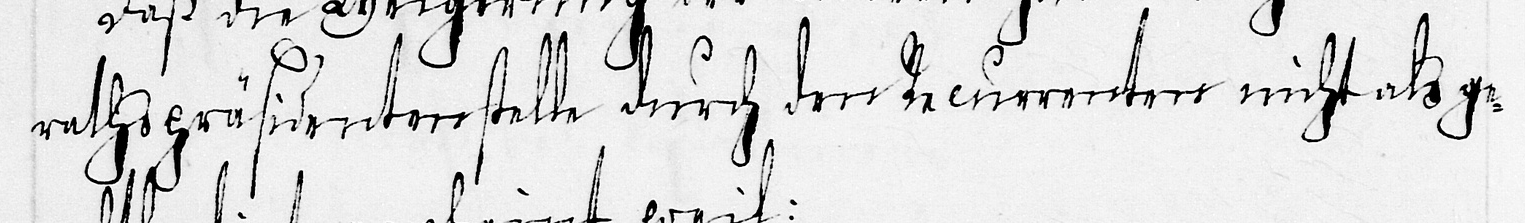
rathspräsidentenstelle durch den Recurrenten nicht als g¬
